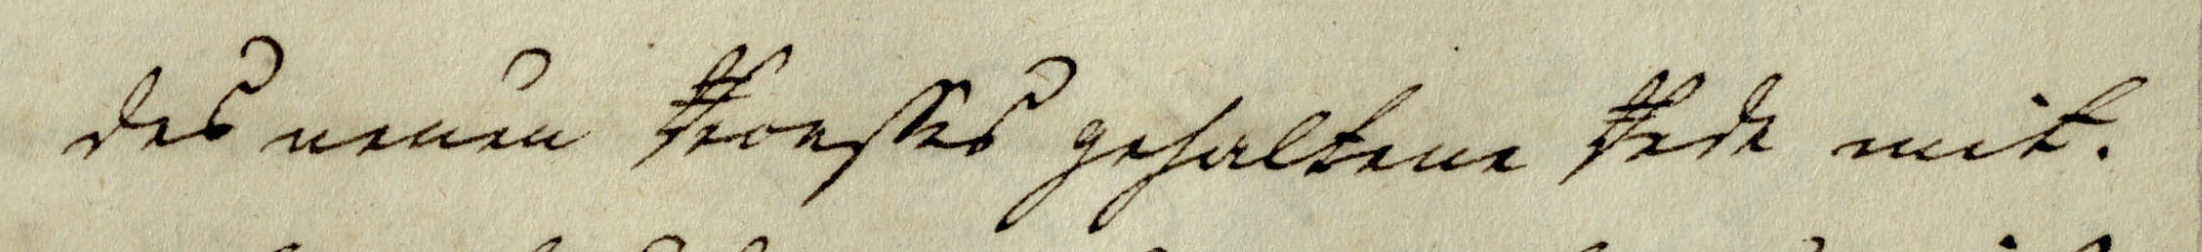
des neuen Recesses gehaltene Rede mit¬
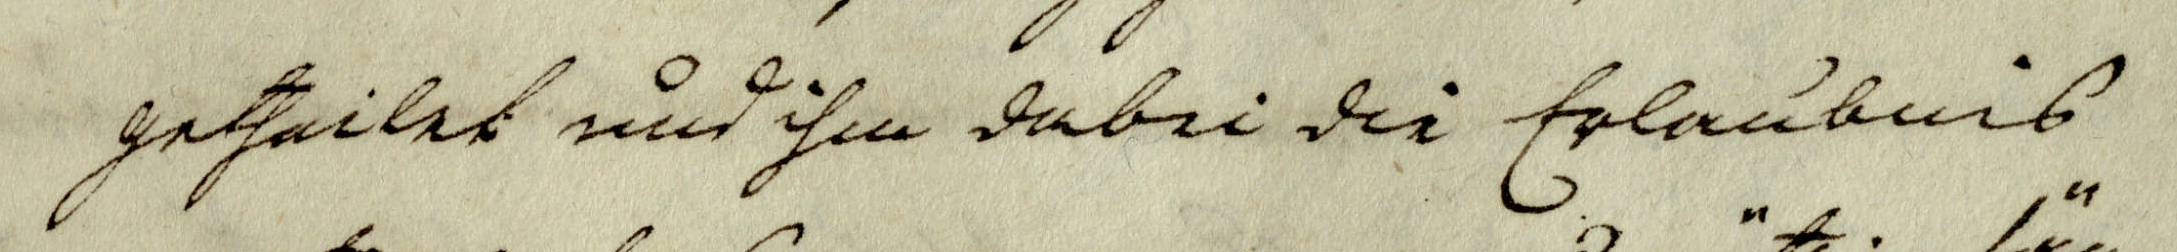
getheilet und ihm dabei die Erlaubnis
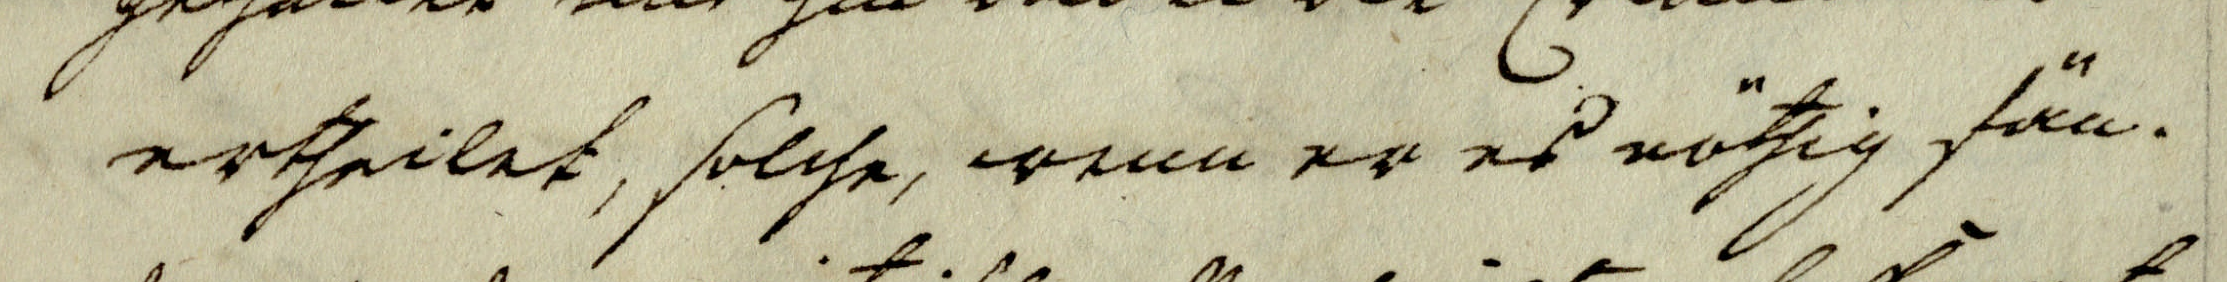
ertheilet, solche, wenn er es nöthig fän¬
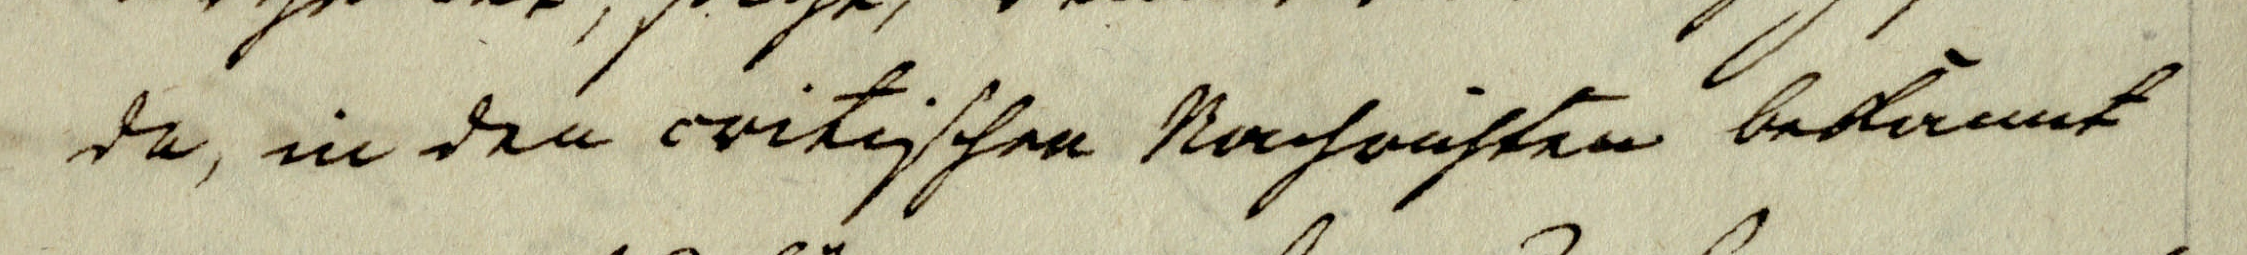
de, in den critischen Nachrichten bekannt
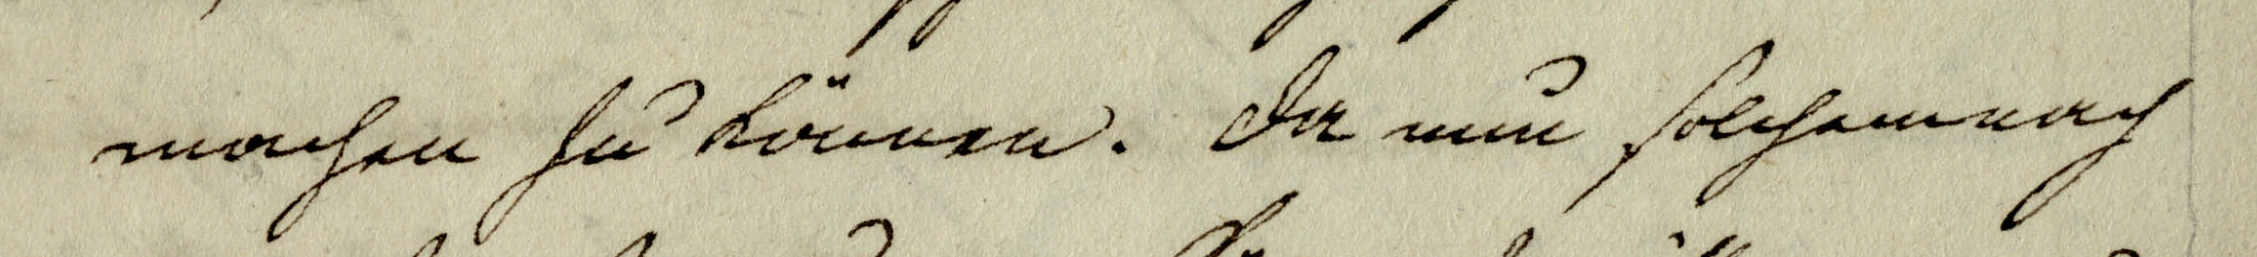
machen zu können. Da nun solchemnach
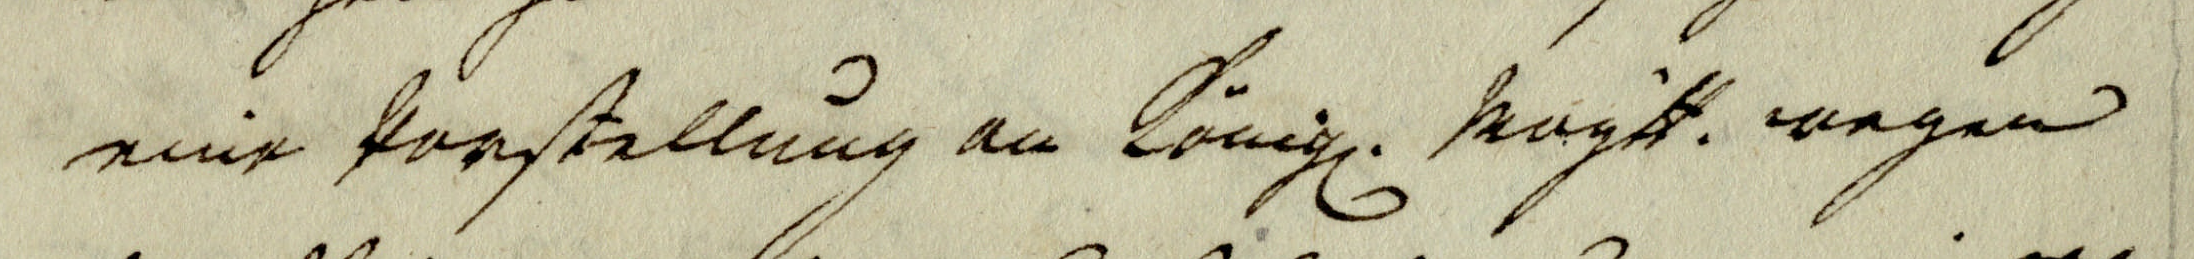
eine Vorstellung an Königl. Maÿtt. wegen
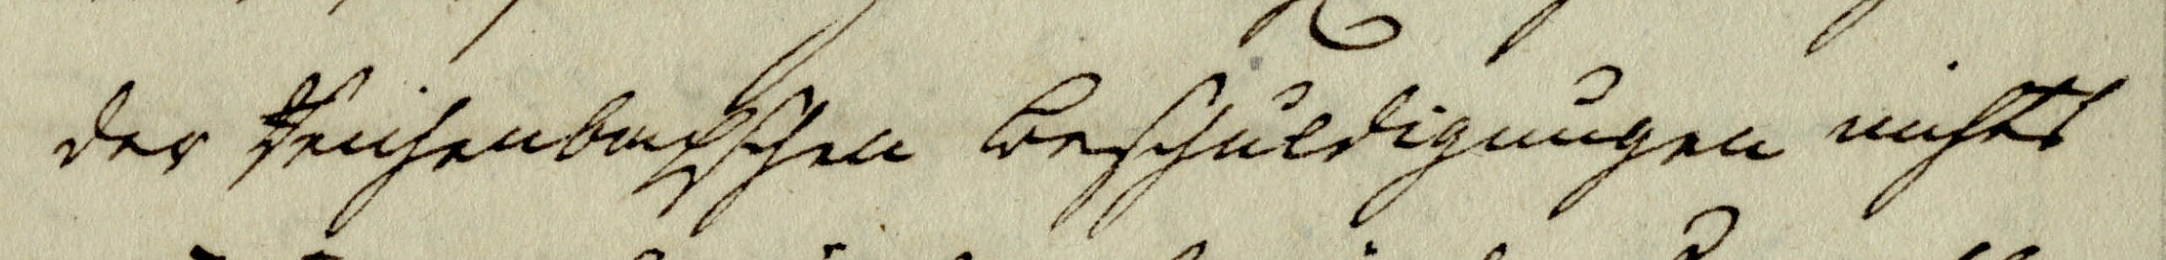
der Reichenbachschen Beschuldigungen nichts
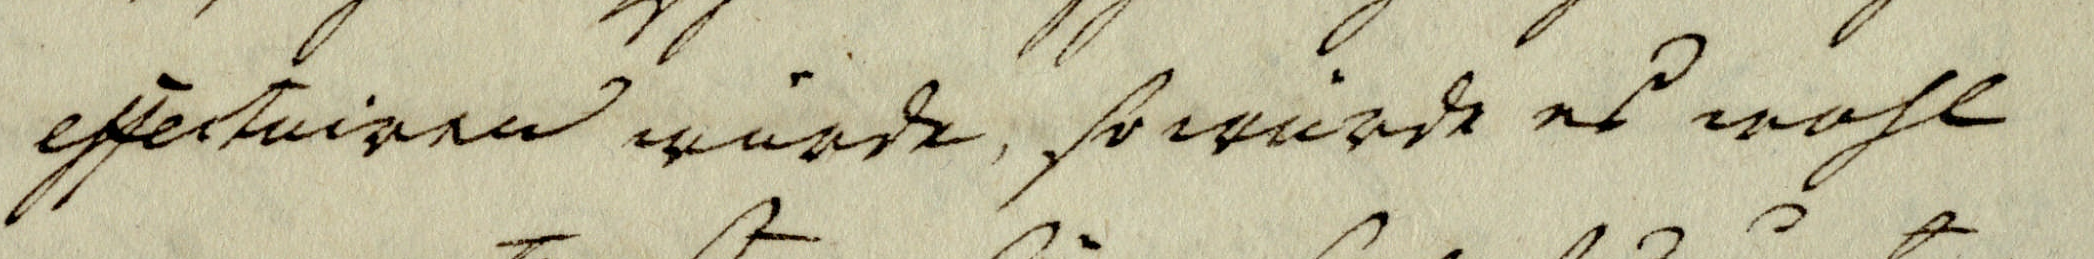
effectuiren würde, so würde es wohl
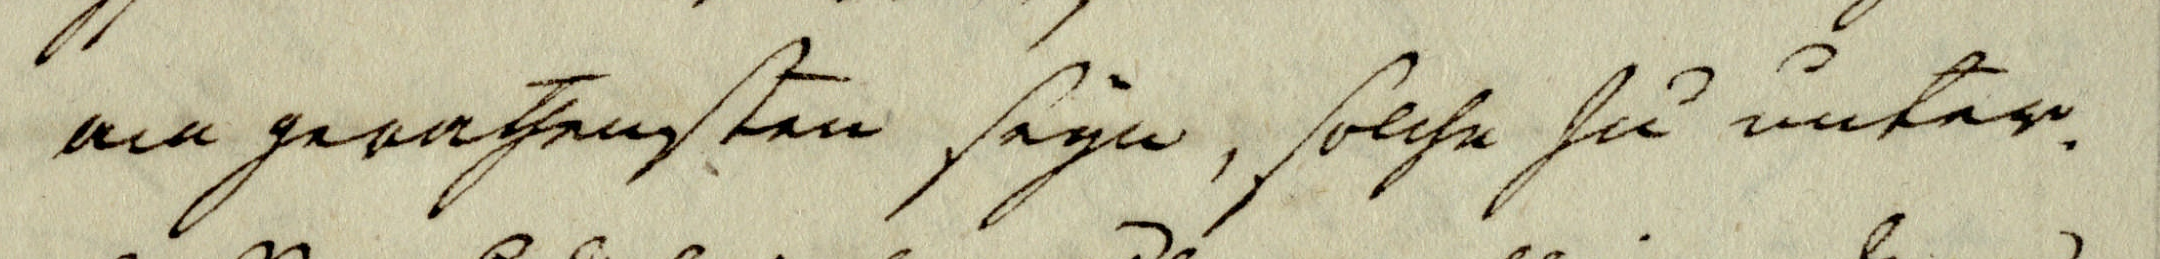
am gerathensten seÿn, solche zu unter¬
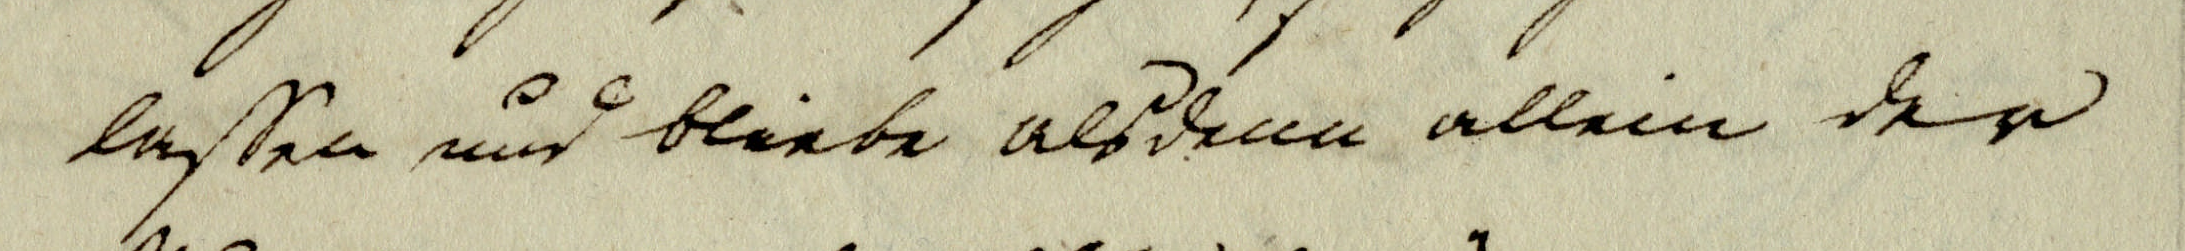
lassen und bliebe alsdenn allein der
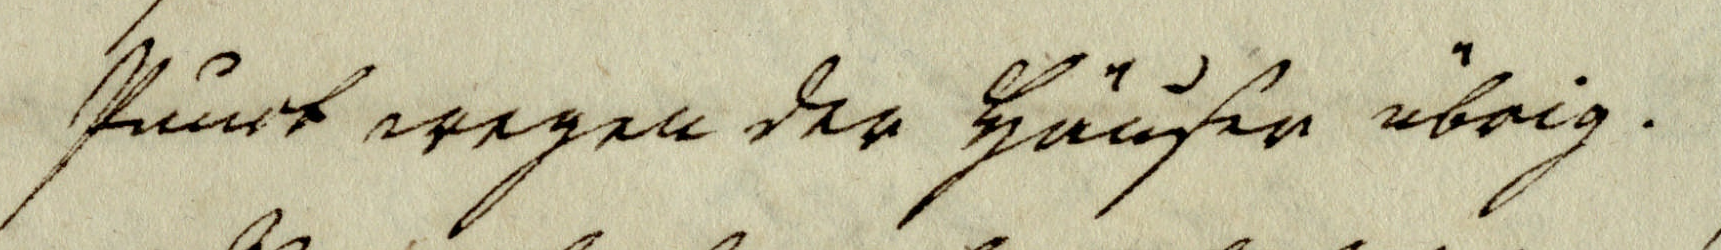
Punct wegen der Häuser übrig.
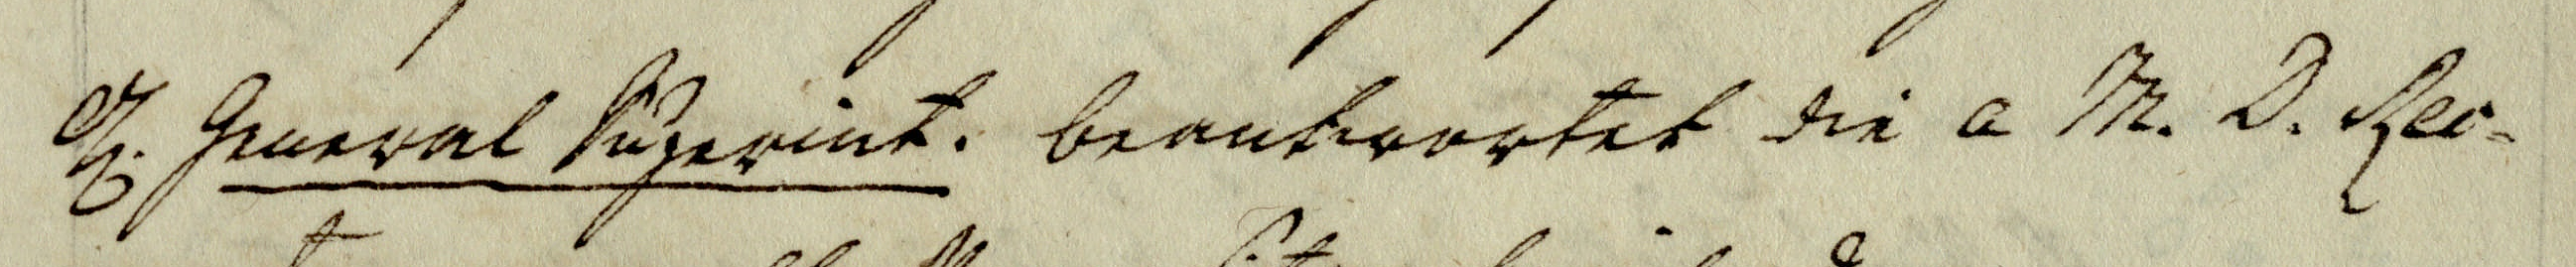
dh. General Superint. beantwortet die a M. D. Rec¬
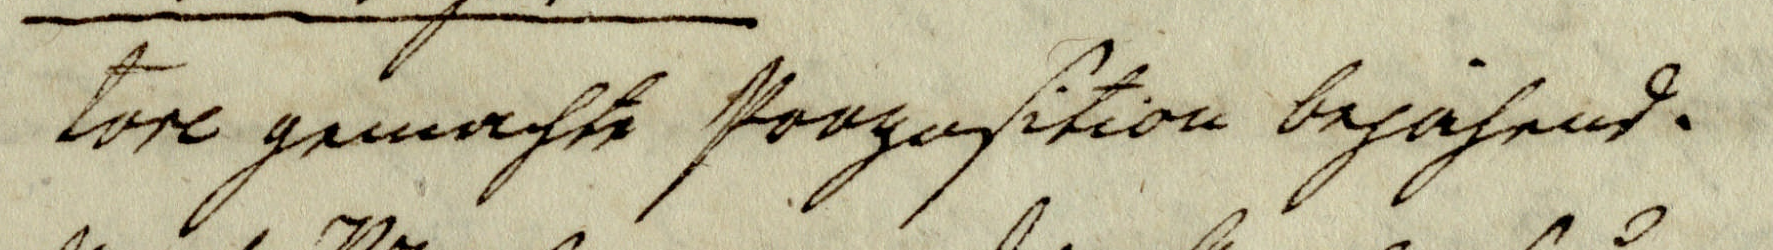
tore gemachte Proposition bejahend.
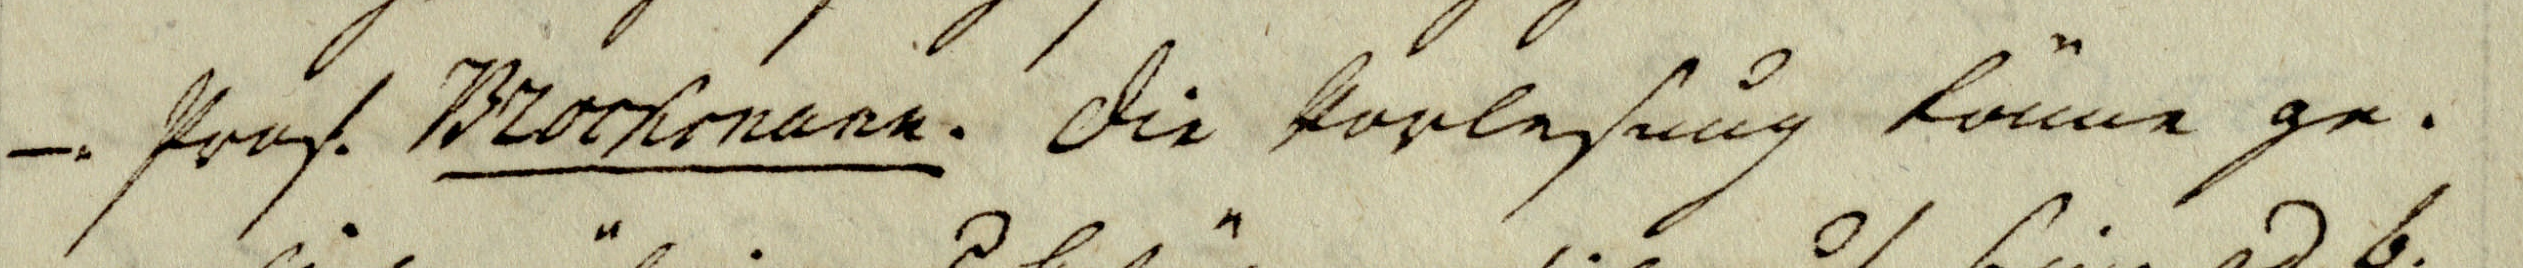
Prof. Brockmann. Die Vorlesung könne ge¬
